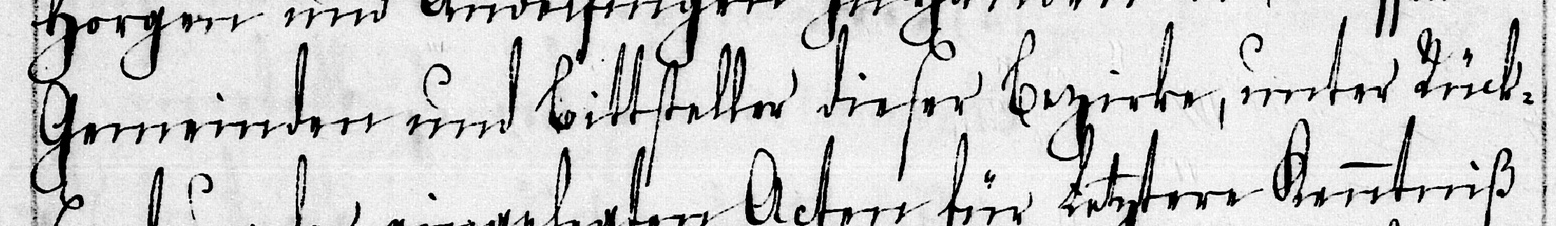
Gemeinden und Bittsteller dieser Bezirke, unter Rück¬
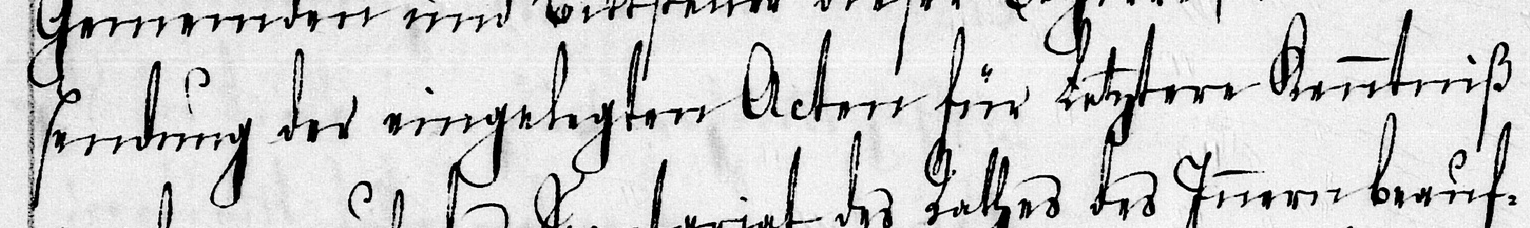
sendung der eingelegten Acten für Letztere Kenntniß
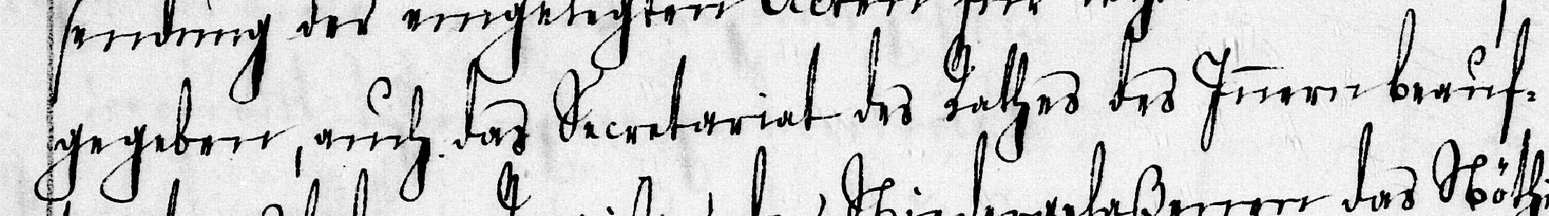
gegeben, auch das Secretariat des Rathes des Innern beauf¬
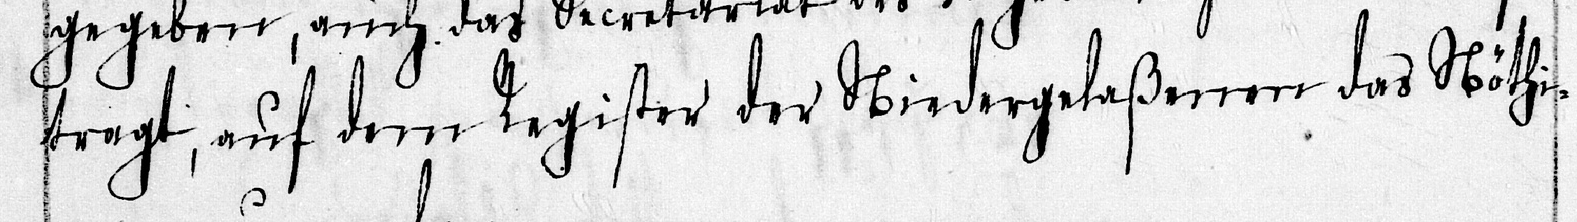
tragt, auf dem Register der Niedergelaßenen das Nöth¬
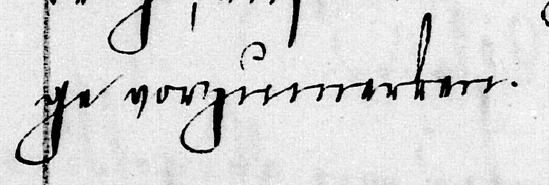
ige vorzumerken.
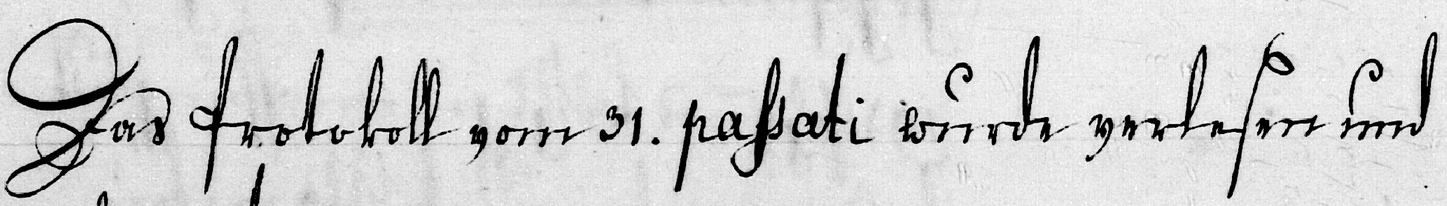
Das Protokoll vom 31. passati wurde verlesen und
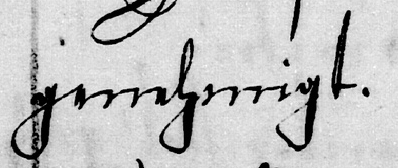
genehmigt.
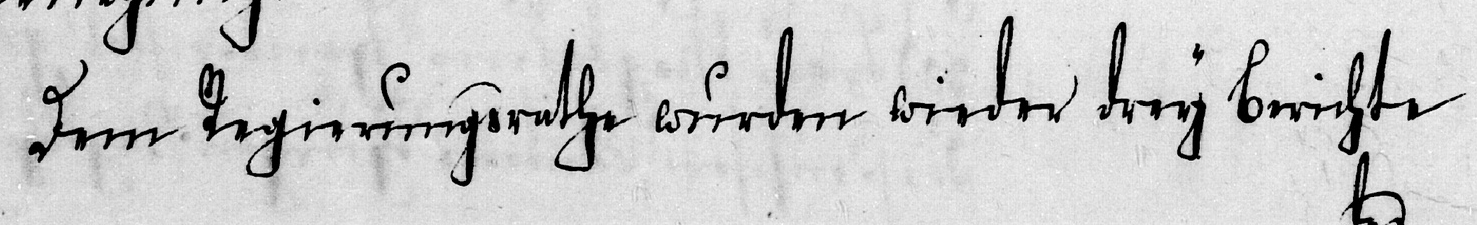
Dem Regierungsrathe wurden wieder drey Berichte
